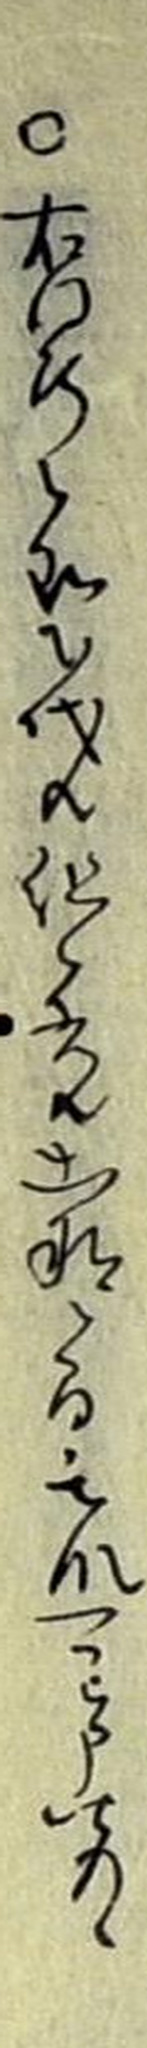〇右同断之趣下代共組之者共出精候間其段可被申聞候

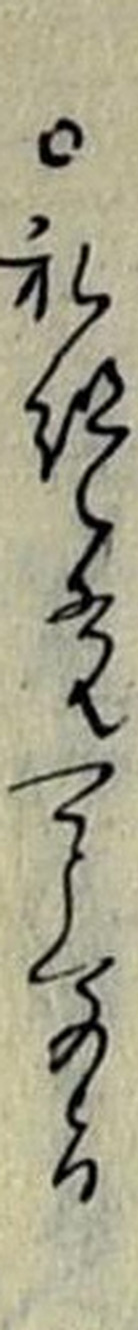〇私組之者共可申聞旨
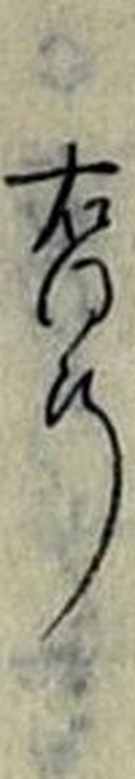右同断
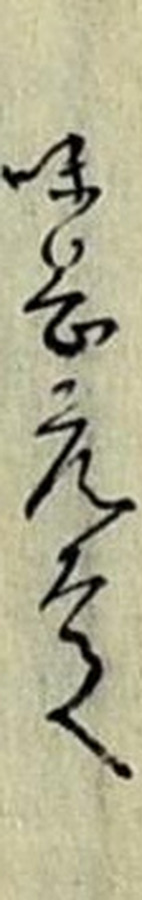味岡彦大夫
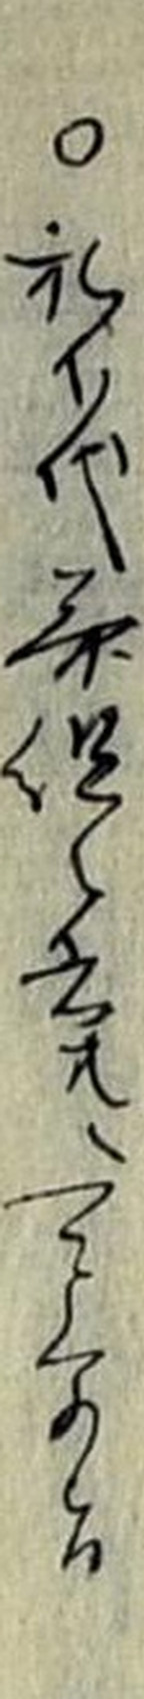〇私下代并組之者共へ可申聞旨
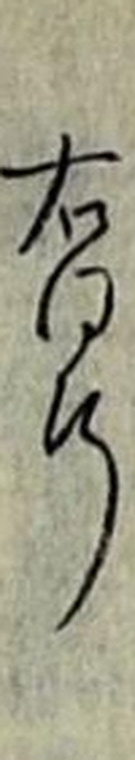右同断
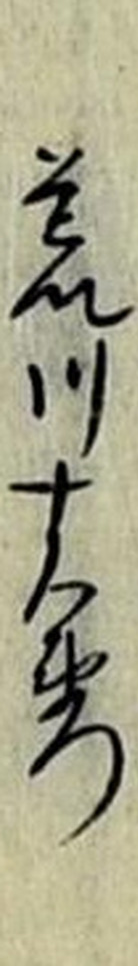荒川十右衛門
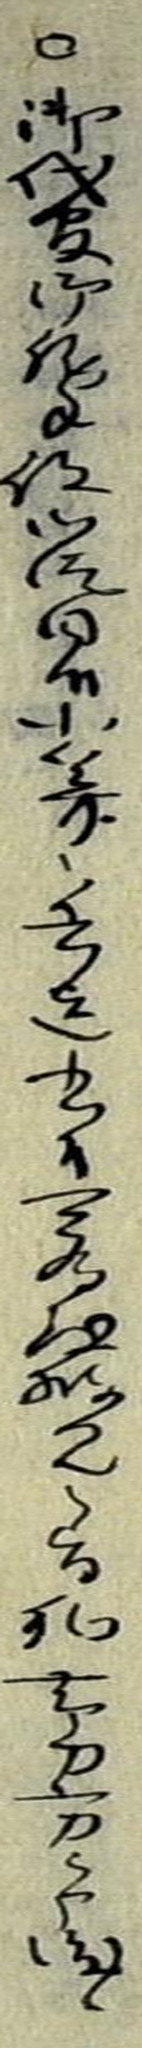〇御代官御勝手役御徒目付小算之者迄書付可為致披見候旨狛帯刀方被申渡候
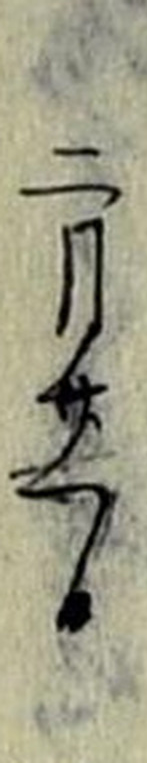二月廿一日
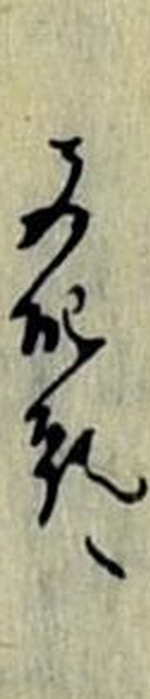支配頭へ
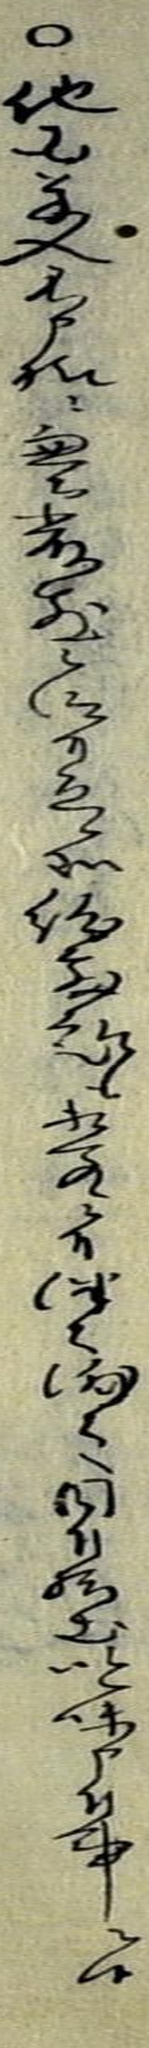〇他国米入不申様ニ兼而厳敷被仰付置候処紛敷趣も相聞候ニ付津々浦々へ目付指出吟味申付事ニ候
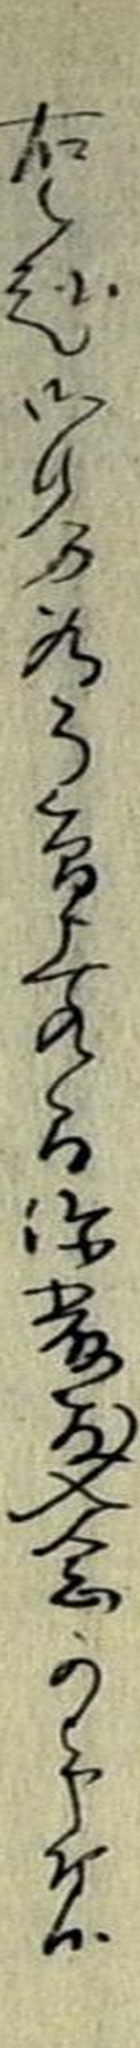右之趣御自分為了簡申聞候間弥厳敷入念可被申付候
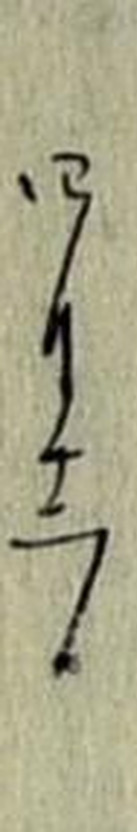四月十二日
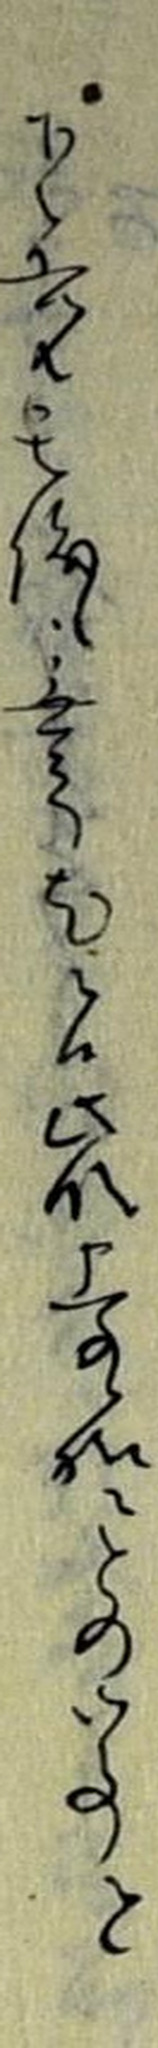下之者共其儀も無之尤ニ候此段申聞候様ニとの御事ニ候
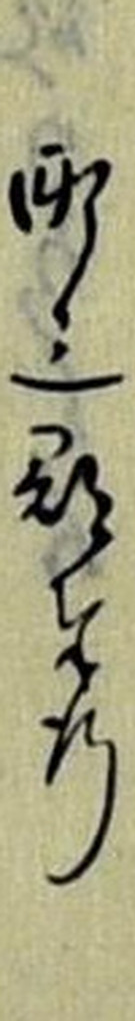町三郡奉行
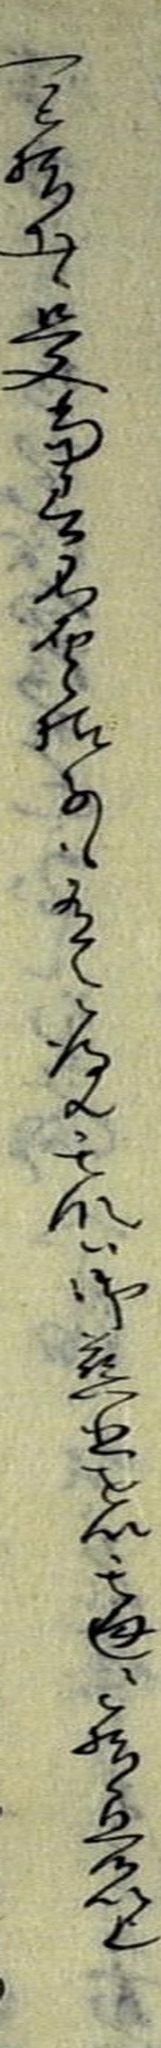可被指出候且又当春不届之様子も有之候得共其段ハ御慈悲を以其通ニ被指置候以上
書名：命令之部 一
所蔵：福井県文書館 Fukui Prefectural Archives
